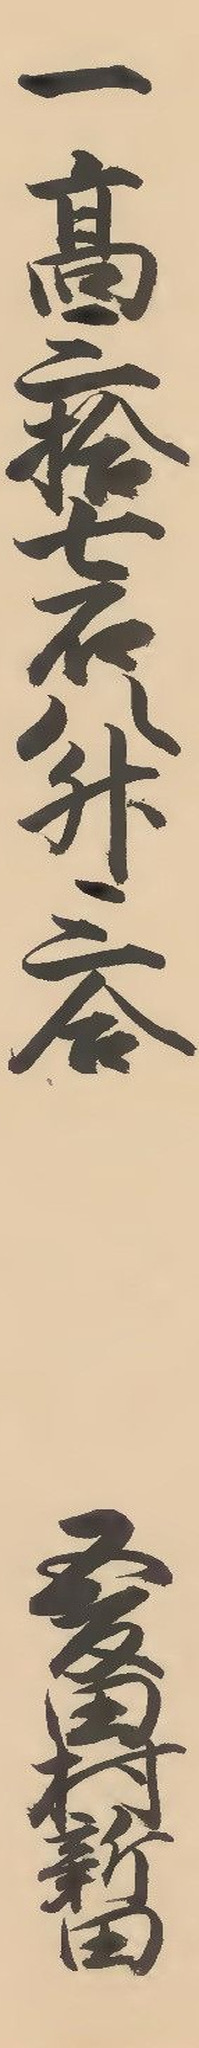一高三拾七石八升三合五反田村新田
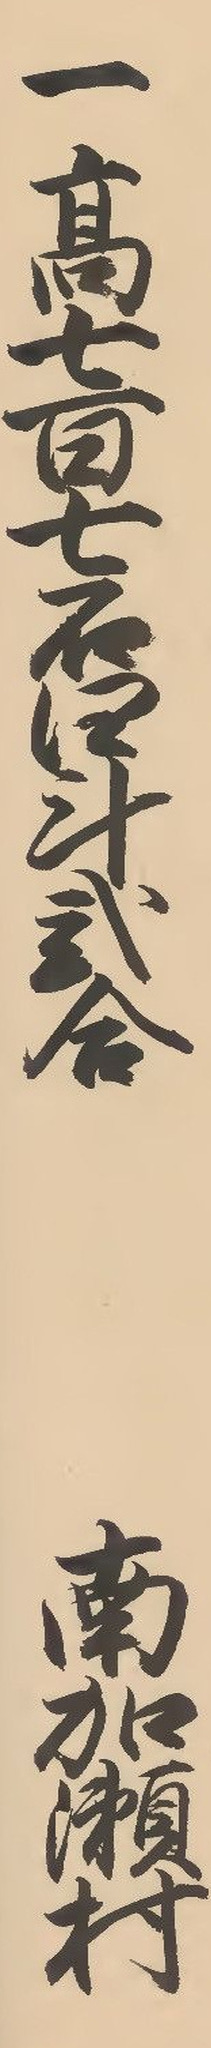一高七百七石四斗弐合南加瀬村
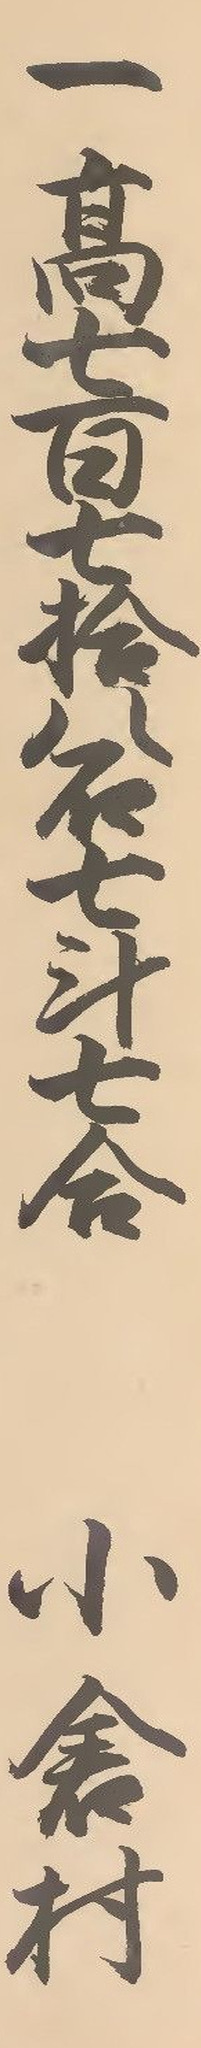一高七百七拾八石七斗七合小倉村
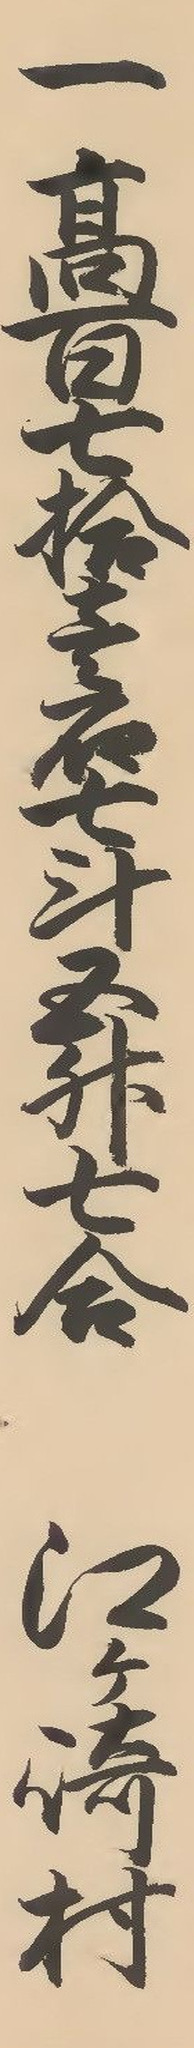一高百七拾壱石七斗五升七合江ヶ崎村
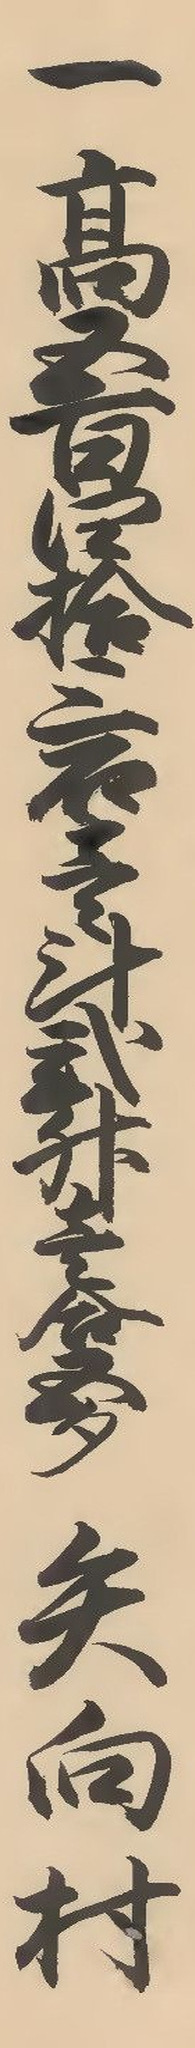一高五百四拾三石壱斗弐升壱合五勺矢向村
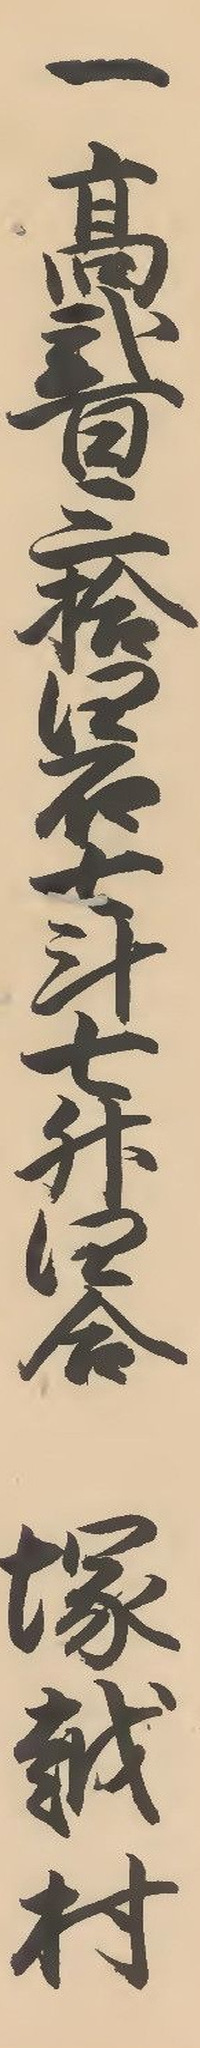一高弐百三拾四石七斗七升四合塚越村

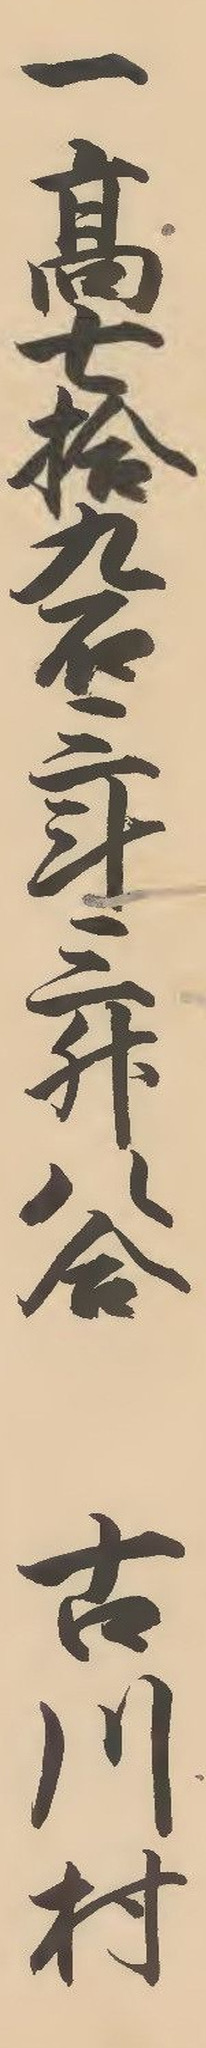一高七拾九石三斗三升八合古川村
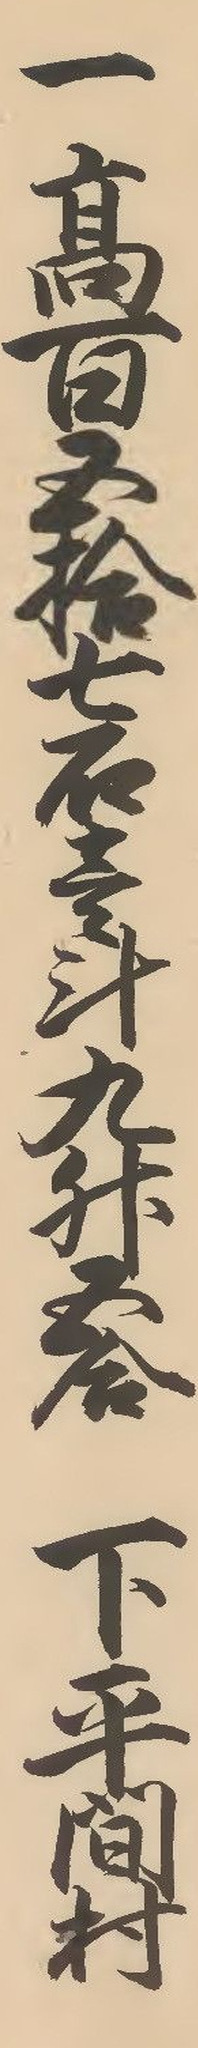一高百五拾七石壱斗九升五合下平間村
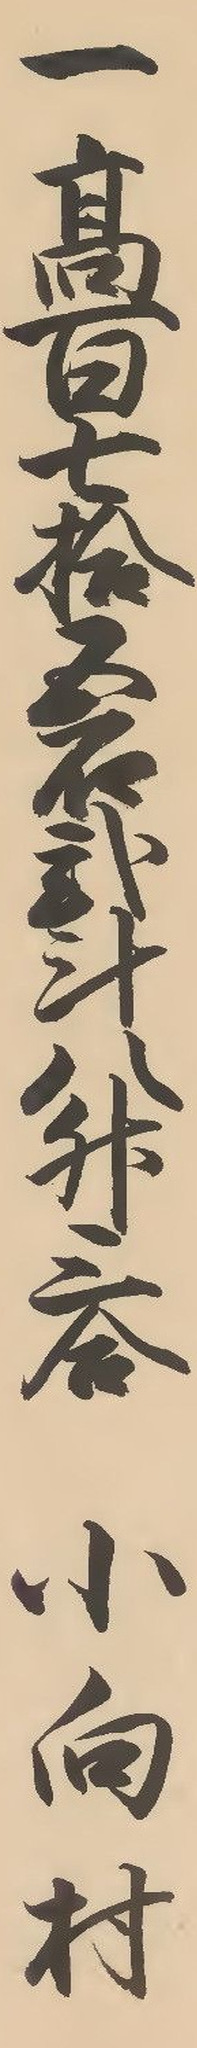一高百七拾五石弐斗八升三合小向村
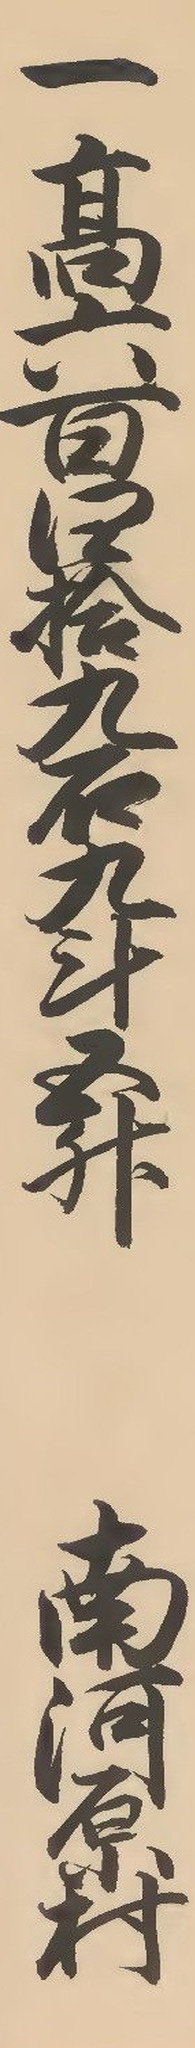一高六百四拾九石九斗五升南河原村
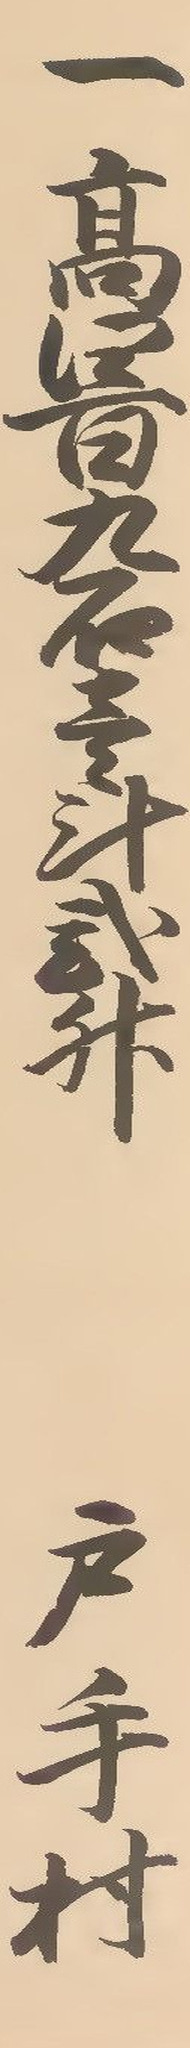一高四百九石壱斗弐升戸手村
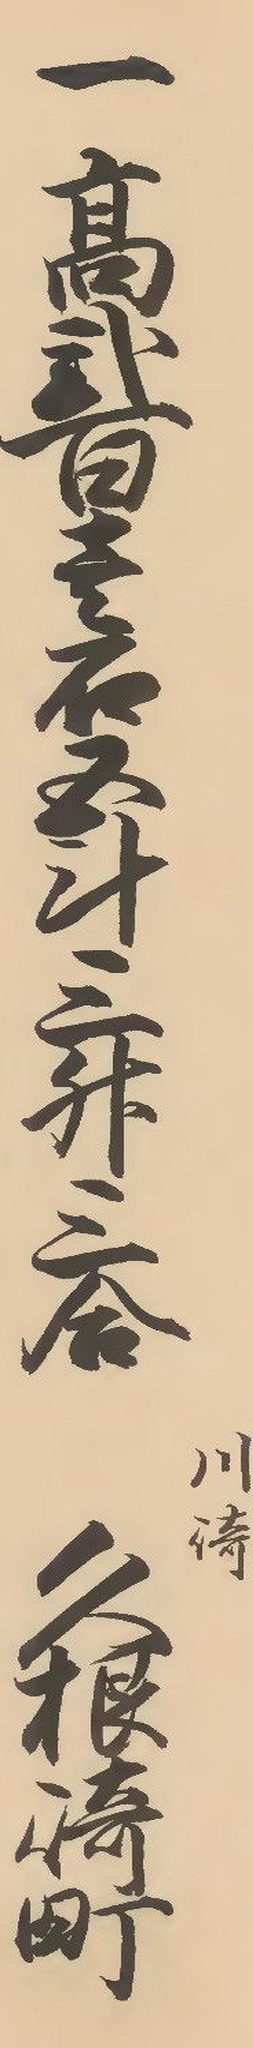一高弐百壱石五斗三升三合久根崎町
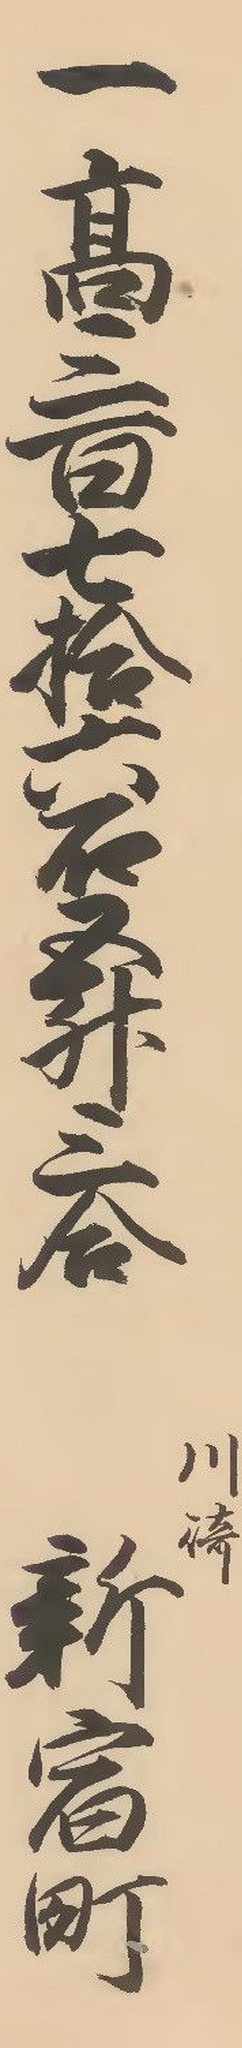一高三百七拾六石五升三合新宿町
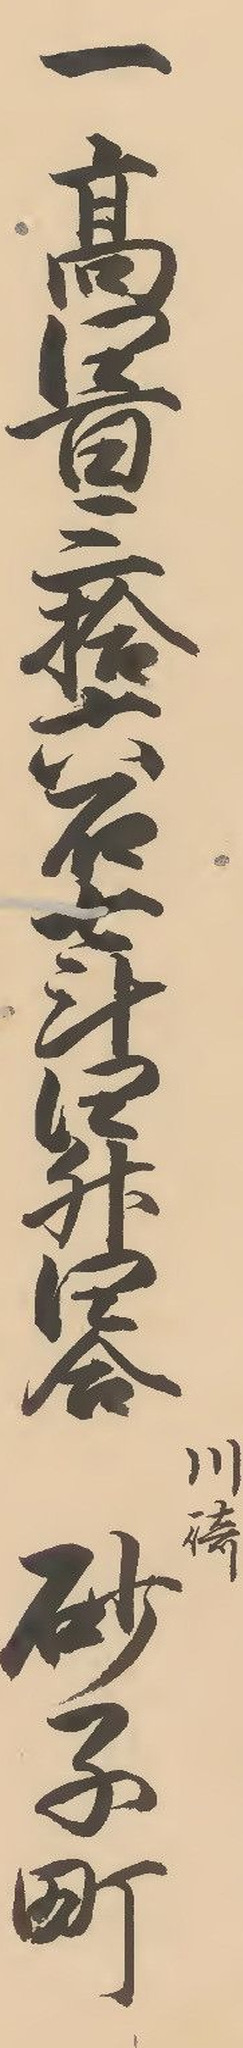一高四百三拾六石七斗四升四合砂子町

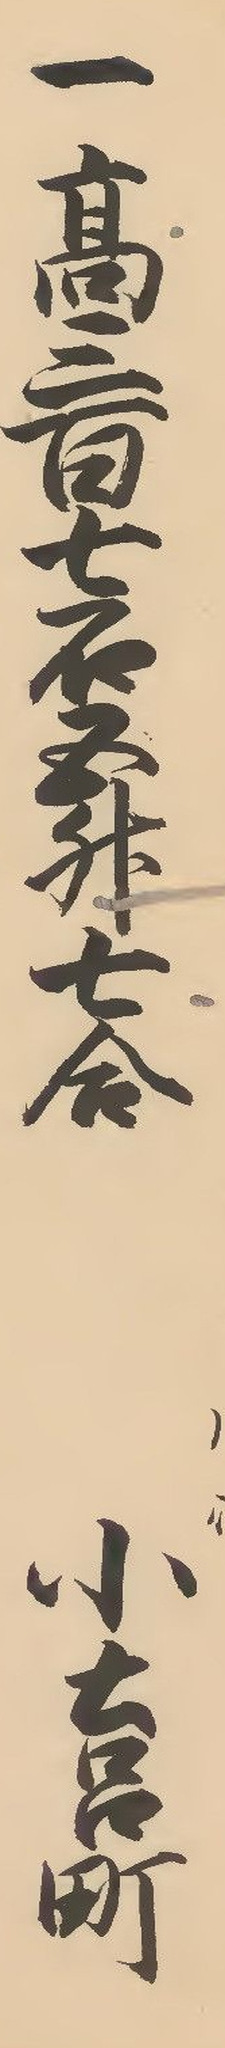一高三百七石五升七合小土呂町
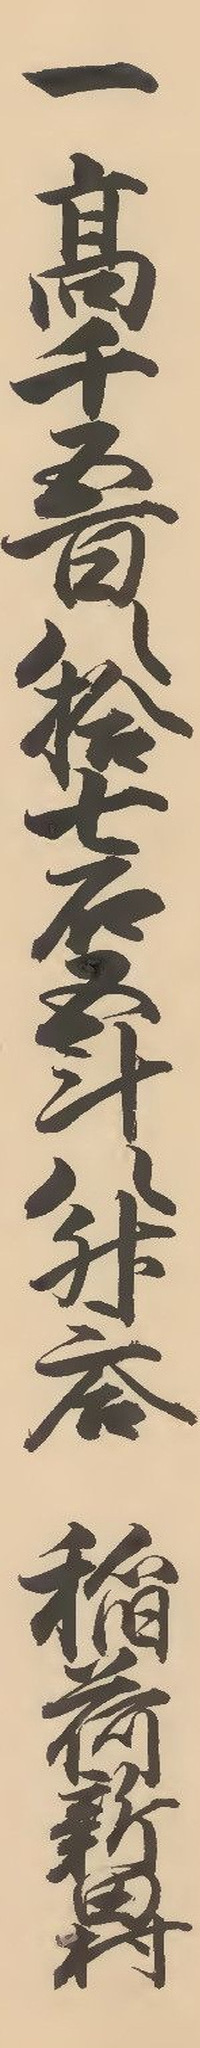一高千五百八拾七石五斗八升三合稲荷新田村
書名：武蔵国郷帳　上
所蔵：国立公文書館 National Archives of Japan
